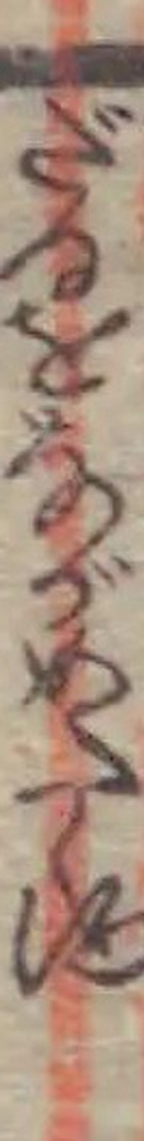だるをながめて酒
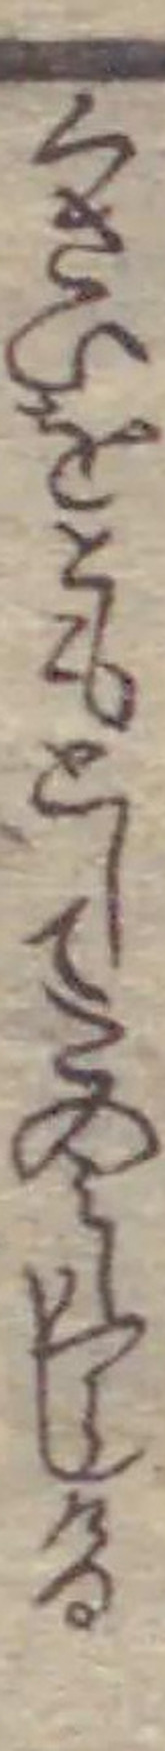くさいをともとしてたのみしくらしける
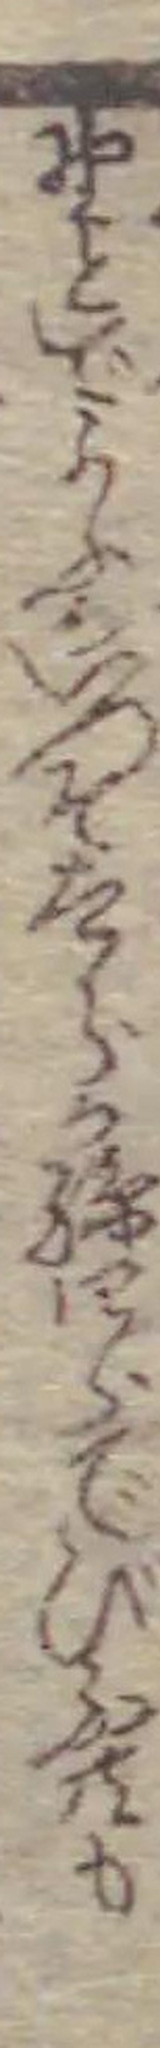野とでよふいつそ太郎か孫四郎でびふ共も
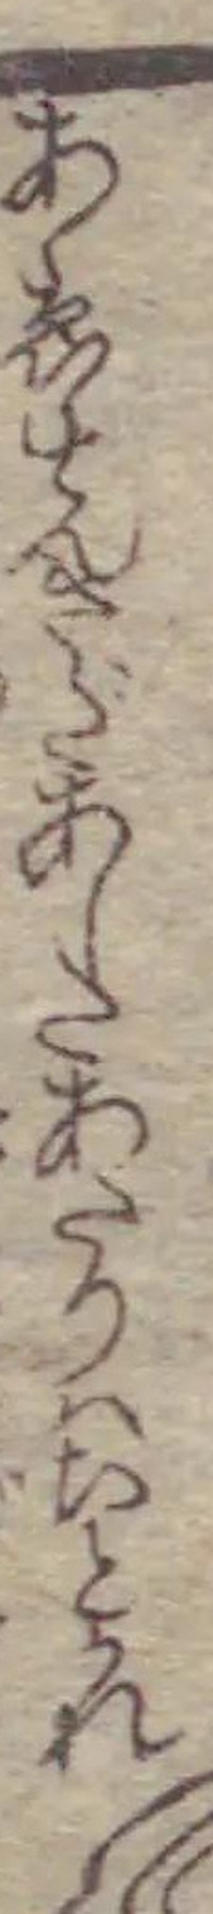あゝゑゝてんきだあしたあたりはちとかれ
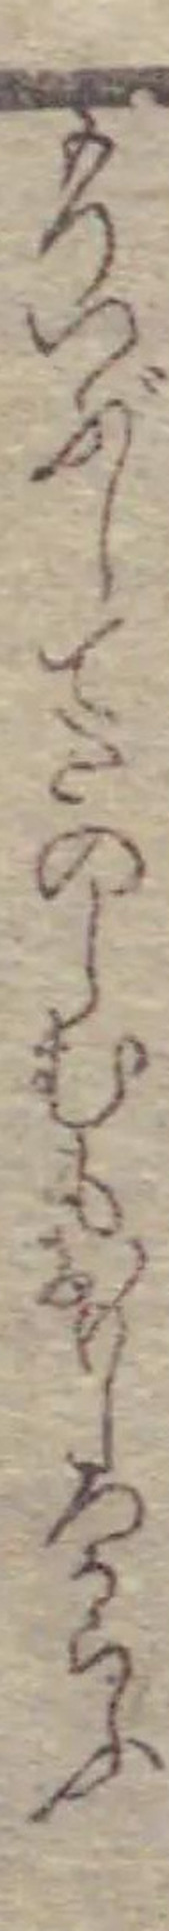もりつぶしてたのしむもおもしろからふ

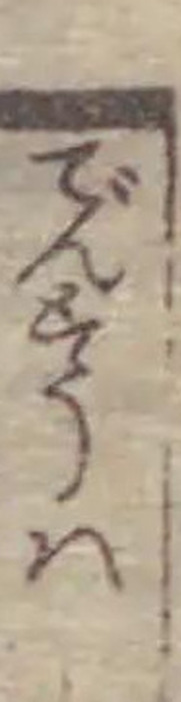でんとうは
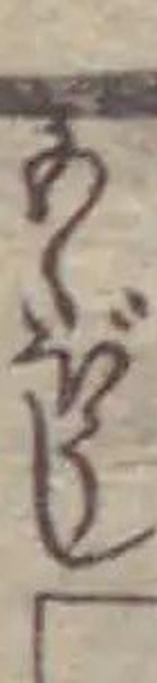もくぼうし
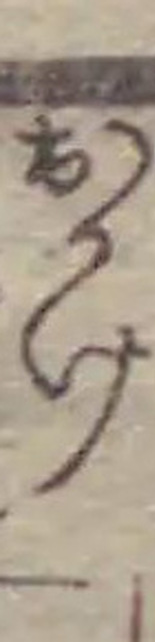出かけ
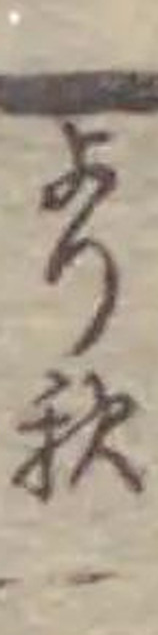より秋
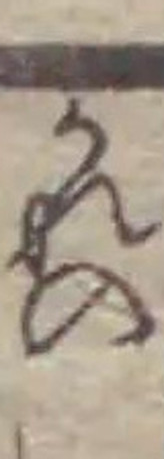かれの
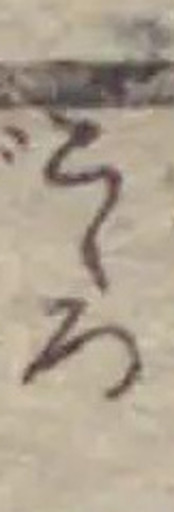こゝろ
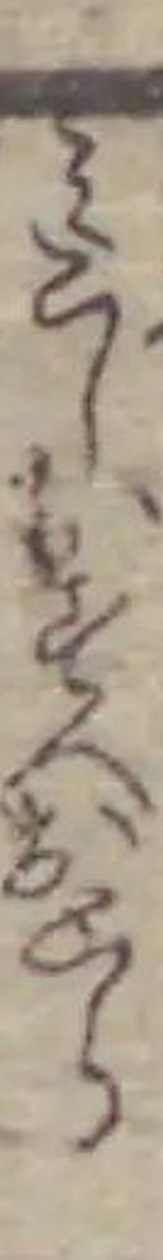みこしおすへおとら
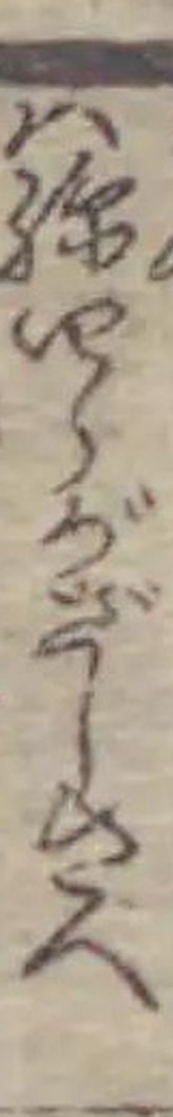は孫四郎がざしきへ
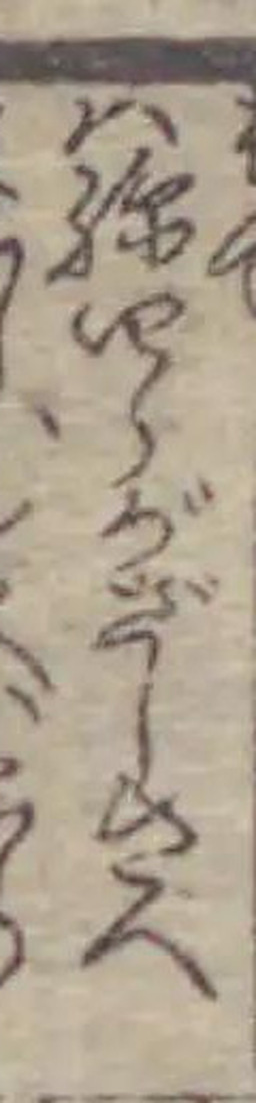は孫四郎がざしきへ
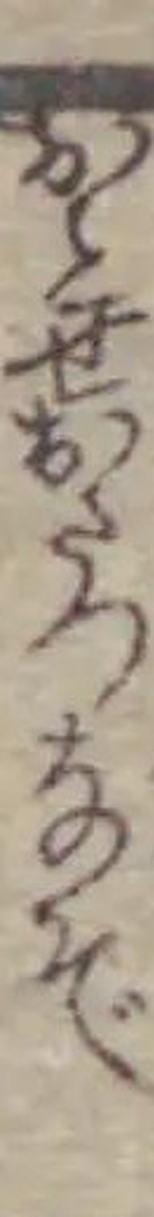おとせおたつなぞ
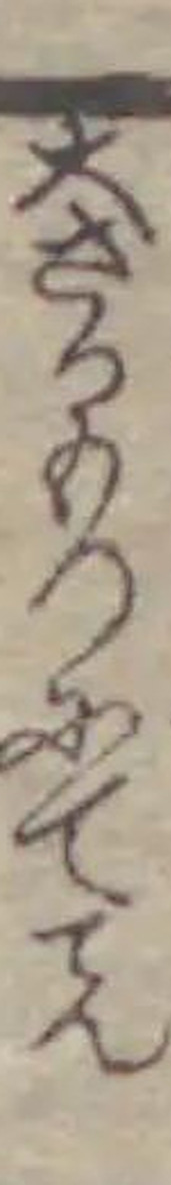大さかもりにててん
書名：藝者五人娘 2巻
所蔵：国立国会図書館 National Diet Library, JAPAN
